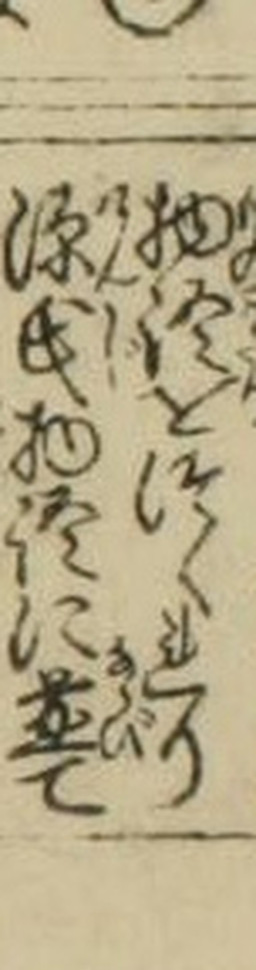源氏物語に並て
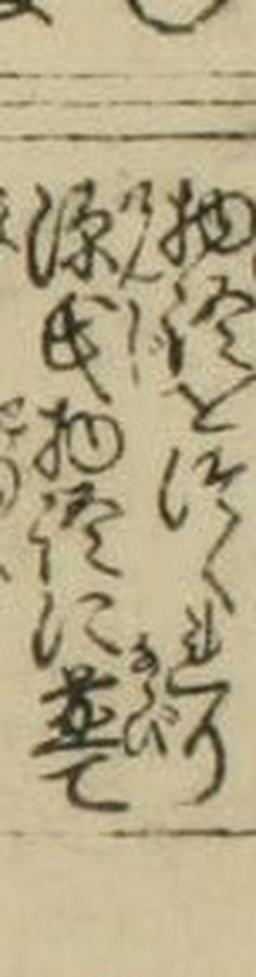源氏物語に並て
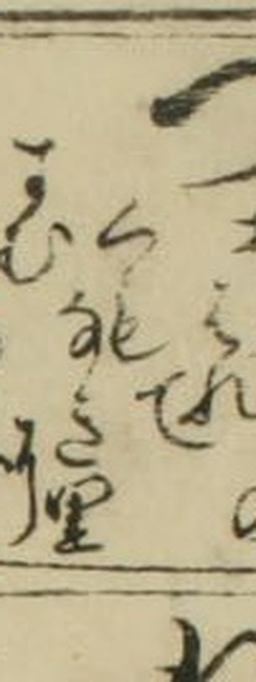くもなき里
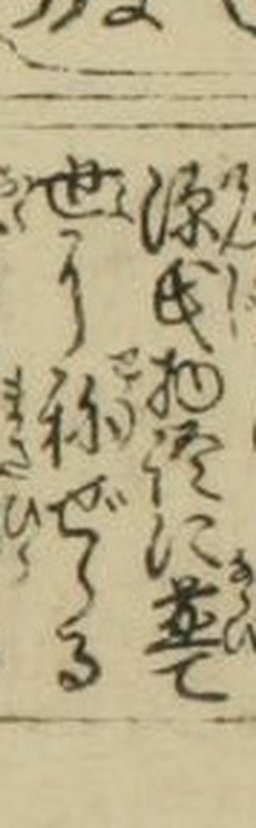世に称ぜらる
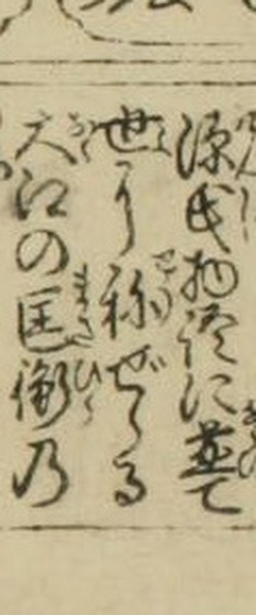世に称ぜらる
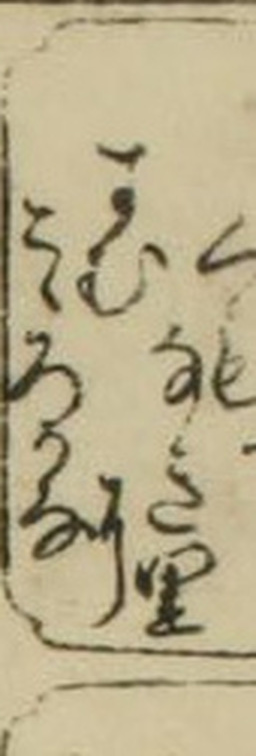こゝろかな
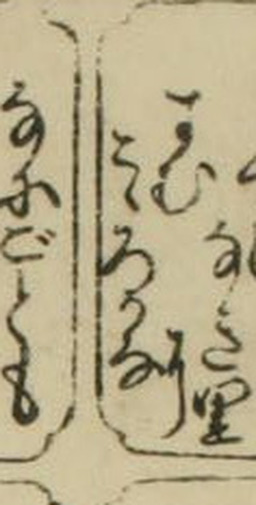こゝろかな
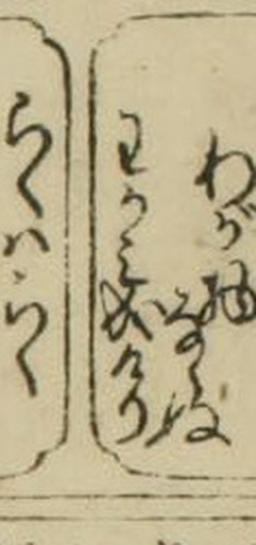わかみ成けり
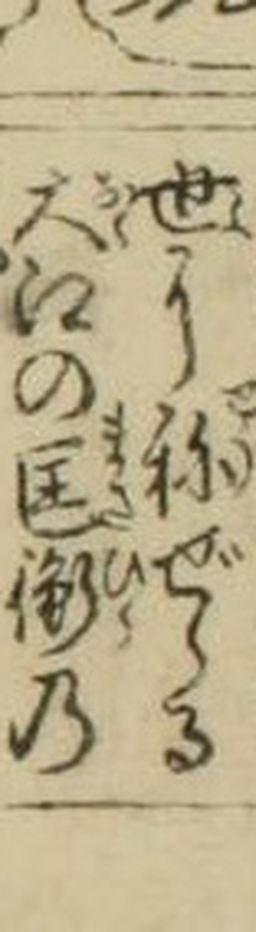大江の匡衡の
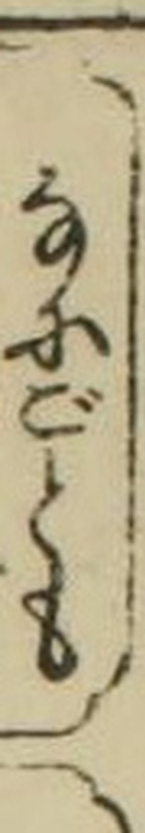なにごとも
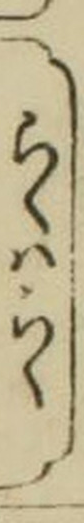らくはらく
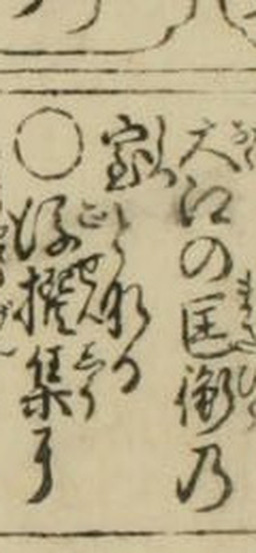室となる
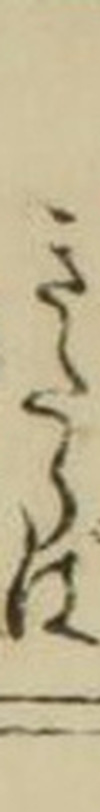きたらば
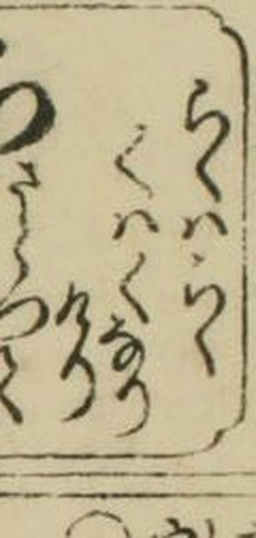くはくなり
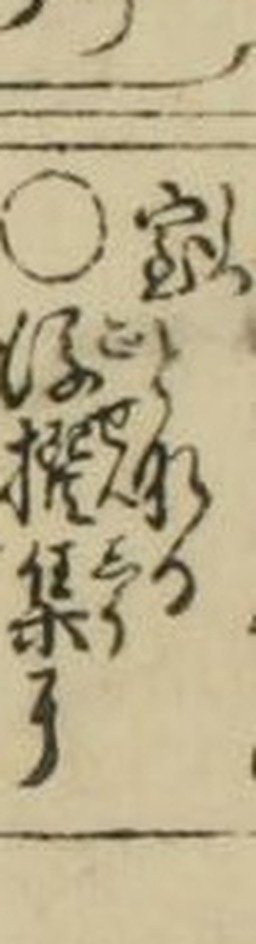◯後撰集に
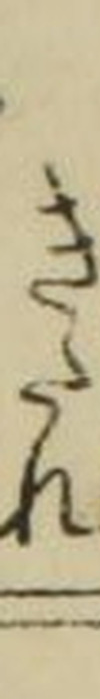きたれ
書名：女源氏教訓鑑
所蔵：東京学芸大学附属図書館
